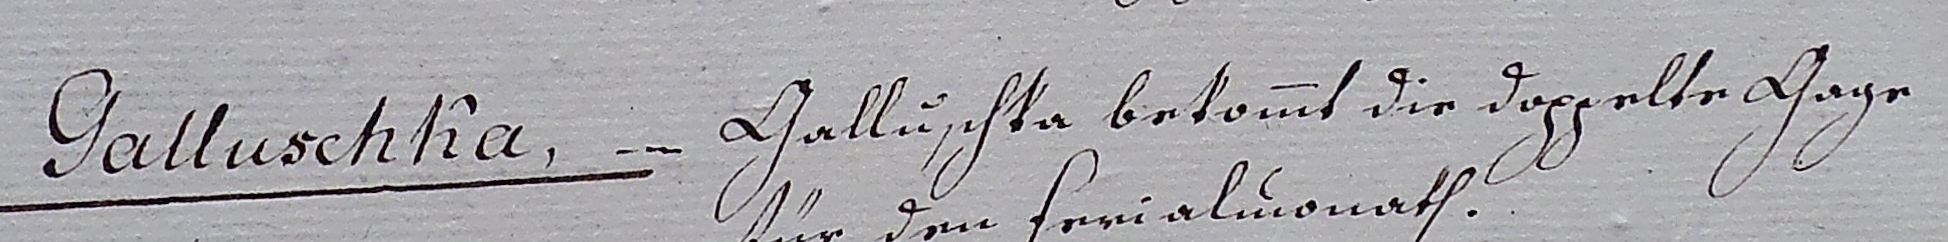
Galluschka, .... Galluschka bekom̅t die dopelte Gage
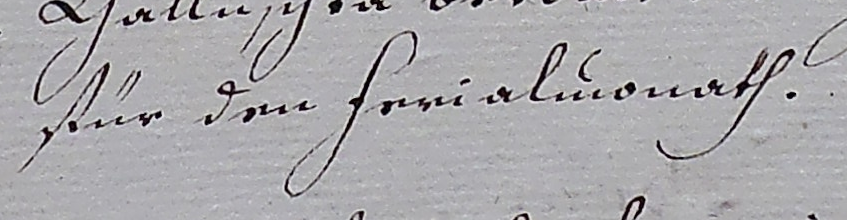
für den Ferialmonath.
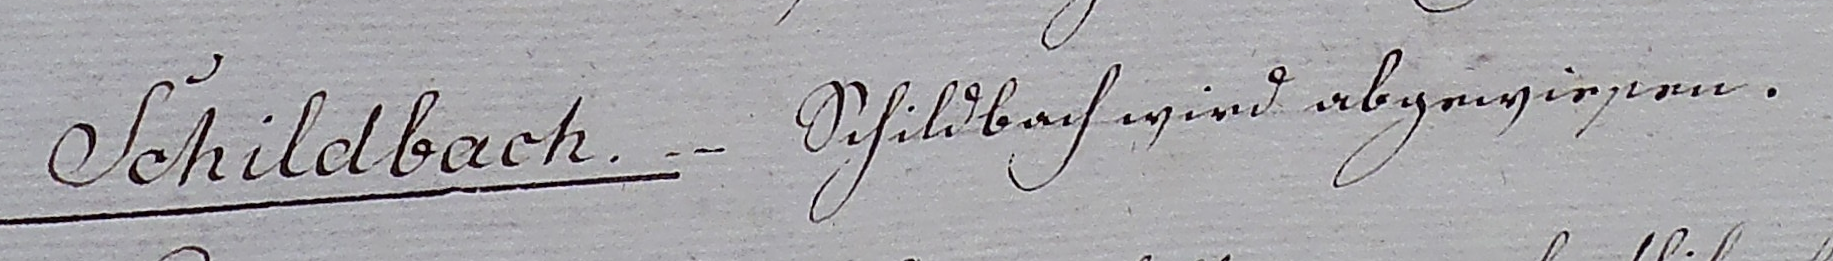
Schildbach. . .. Schildbach wird abgewiesen.
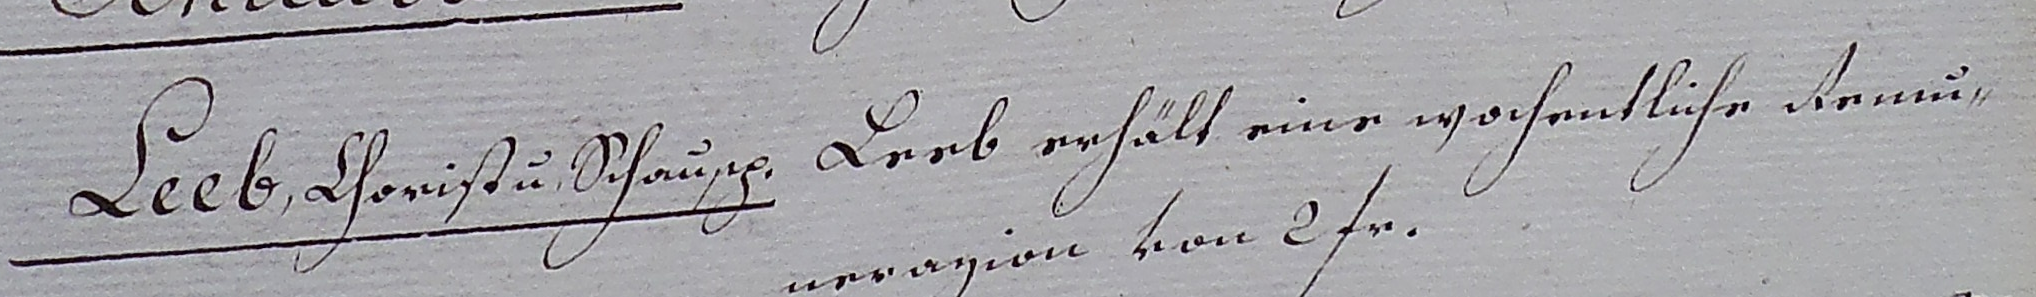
Leeb, Chorist u Schausp: Leeb erhält eine wochentliche Remu¬
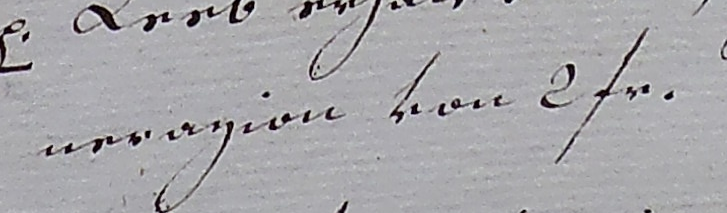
nerazion von 2fr.
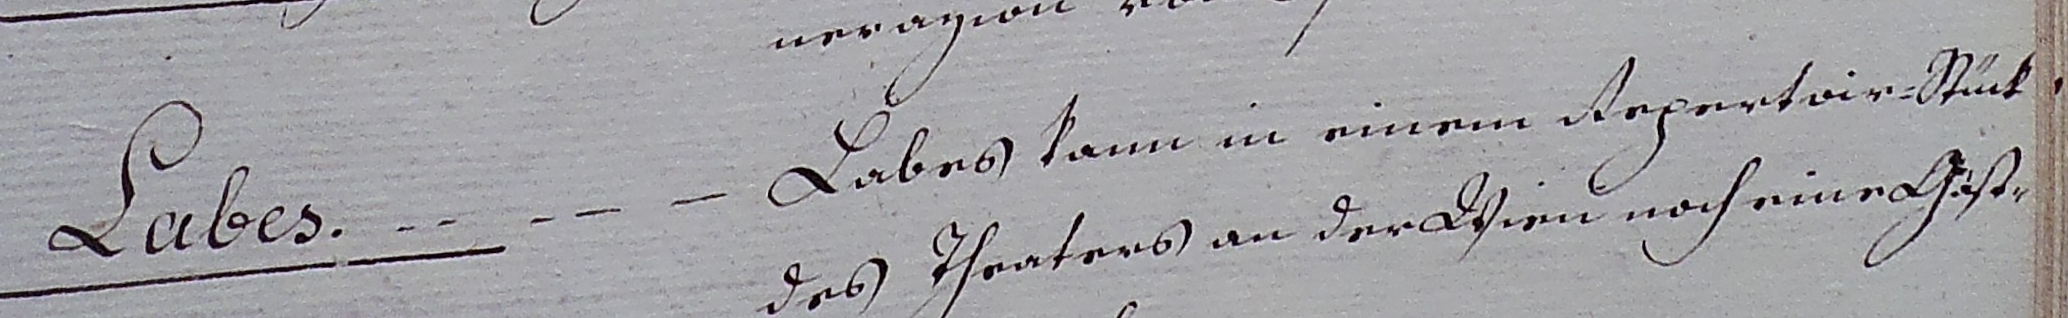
Labes. .. _ _ _ Labes kann in einem Repertoir=Stück
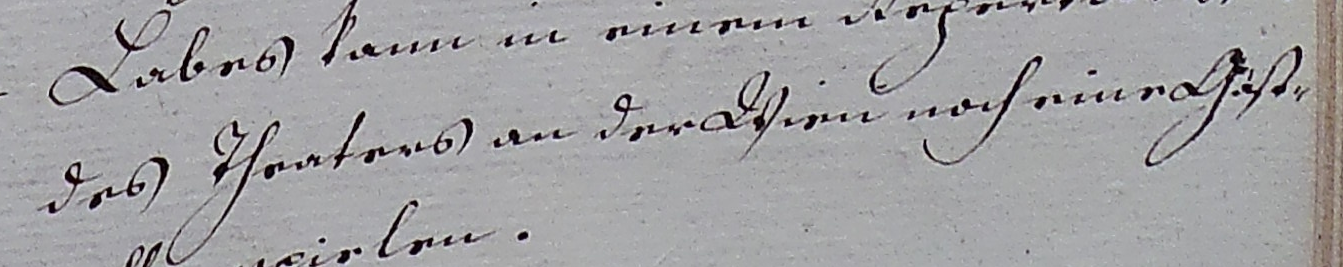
des Theaters an der Wien noch eine Gast¬
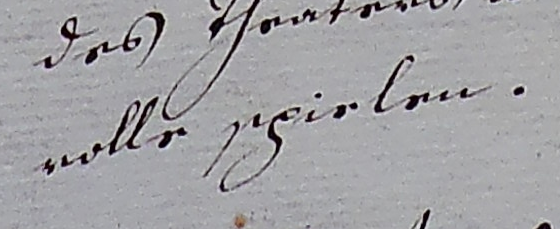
rolle spielen.
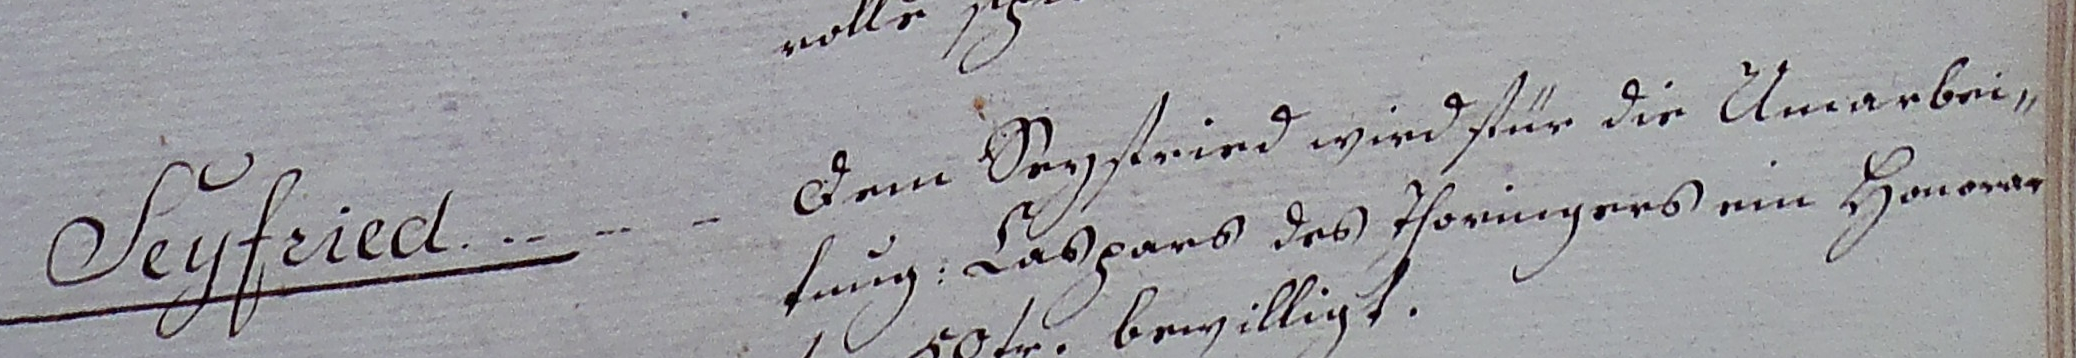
Seyfried. .. .. .. Dem Seyfried wird für die Umarbei¬
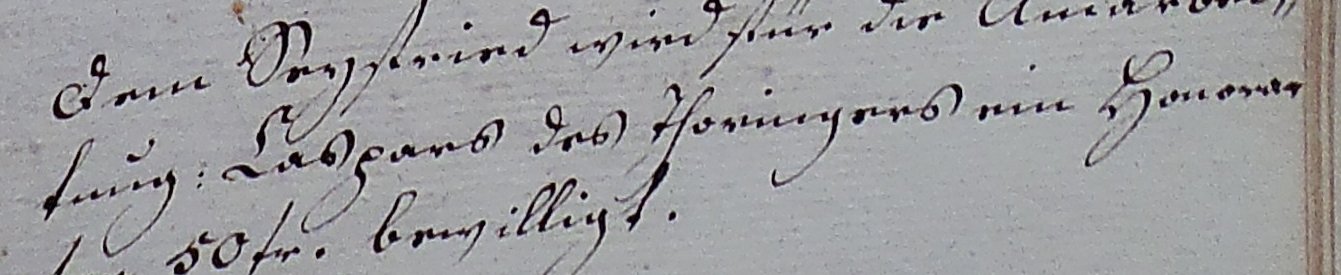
tung Caspars des Thoringers ein Honorar
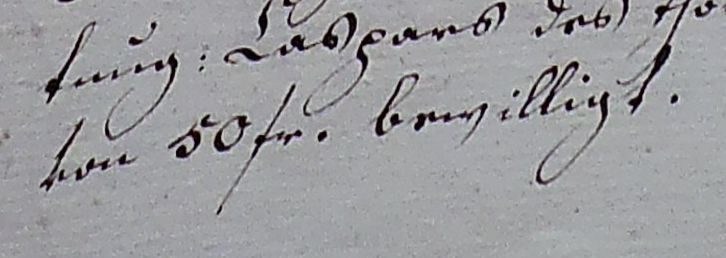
von 50fr. bewilligt.
